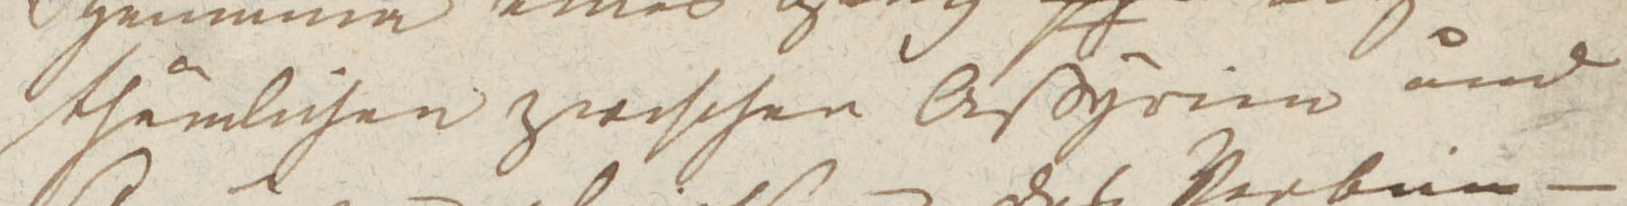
thümlichen zwischen Assyrien und
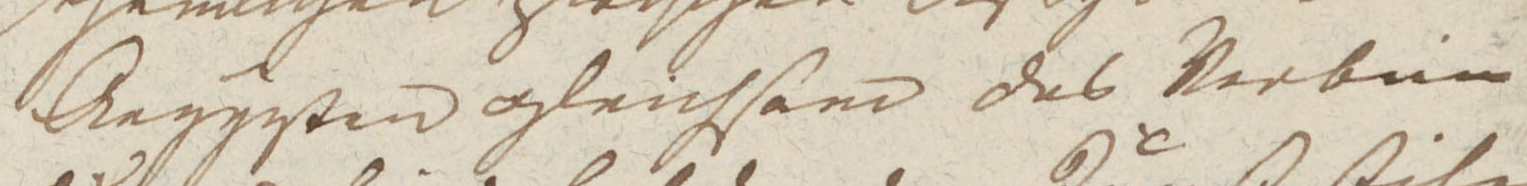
Aegypten gleichsam das Verbin-
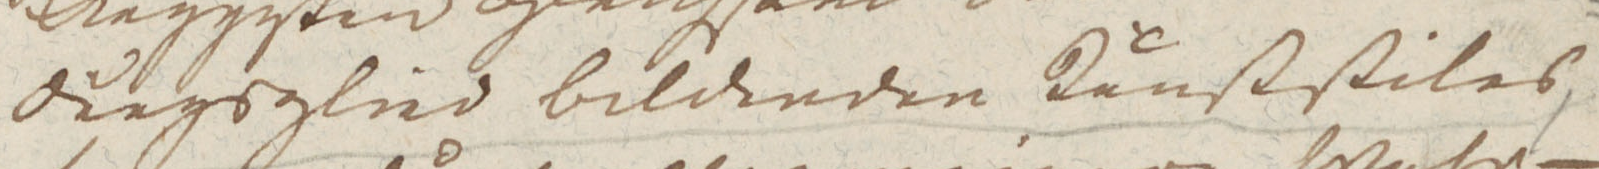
dungsglied bildenden Kunststiles, %
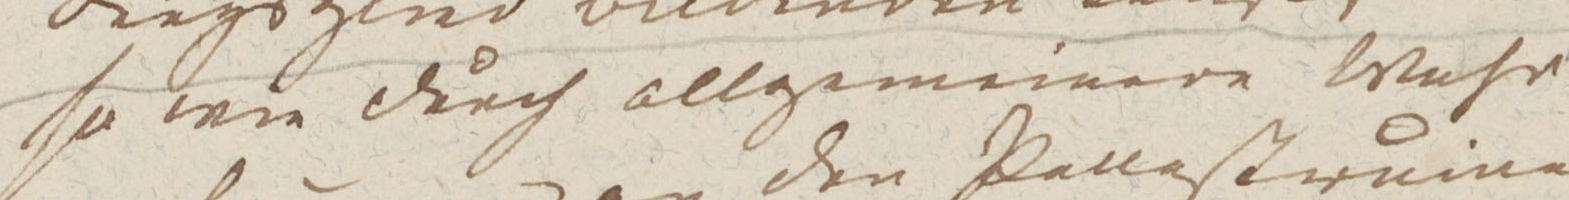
so wie durch allgemeinere Wahr-
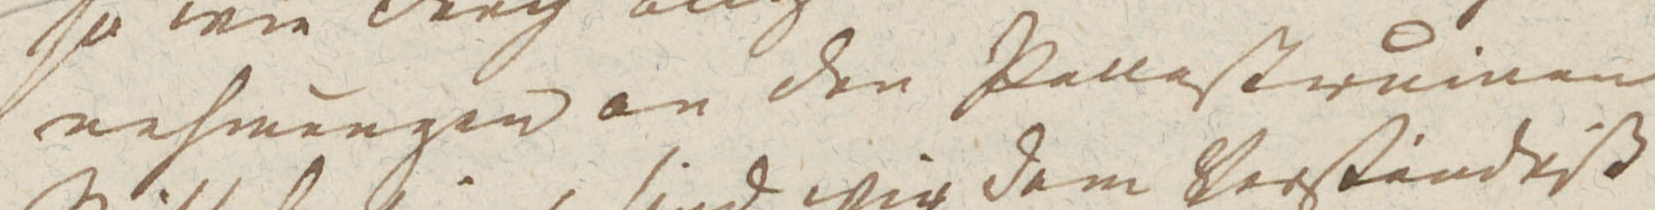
nehmungen an den Pallastruinen
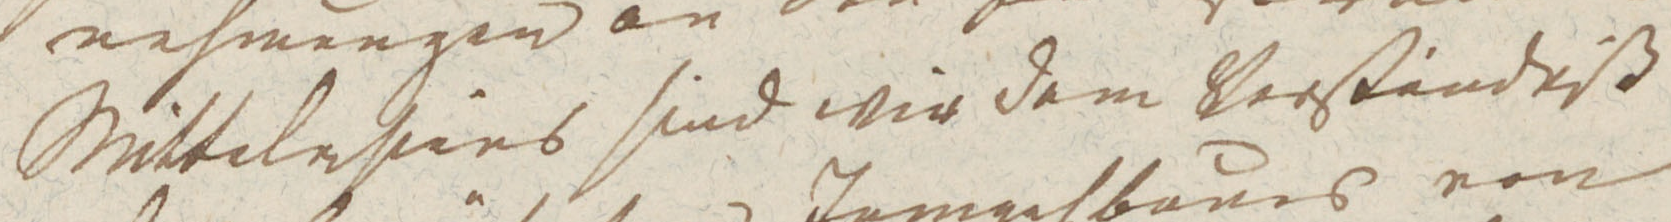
Mittelasiens sind wir dem Verständniss
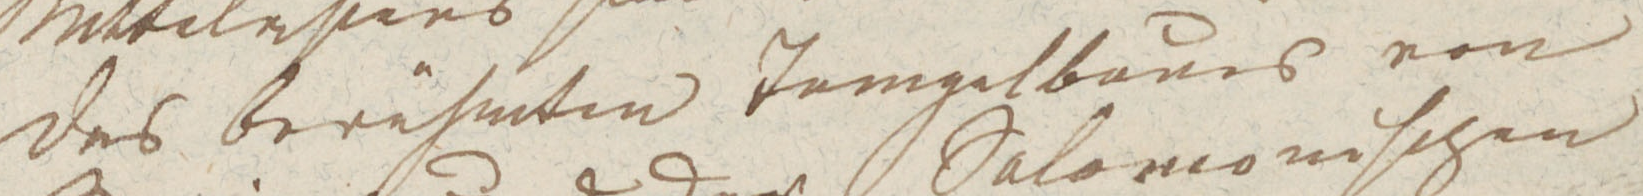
des berühmten Tempelbaues von
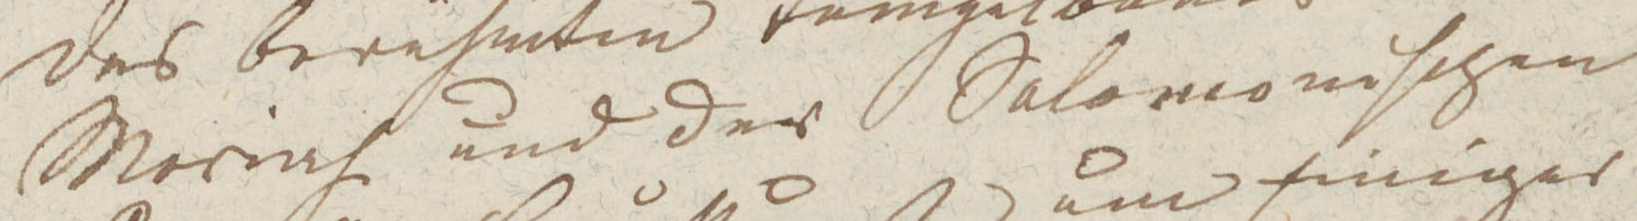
Moriah und der Salomonischen
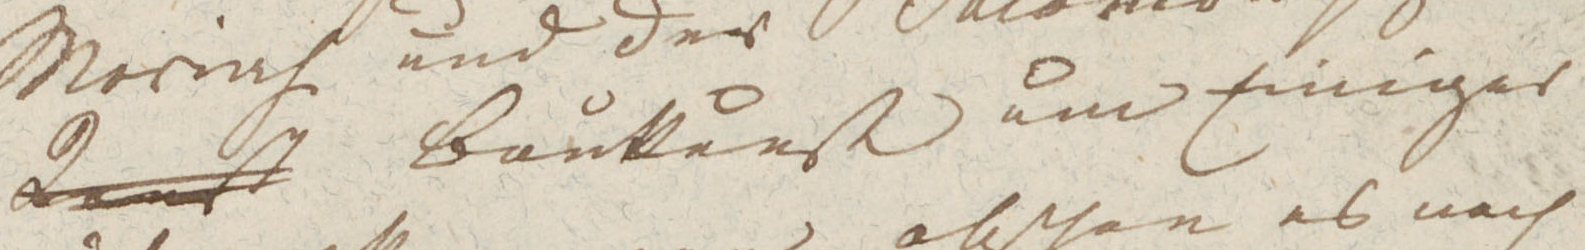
Kunst Baukunst um Einiges
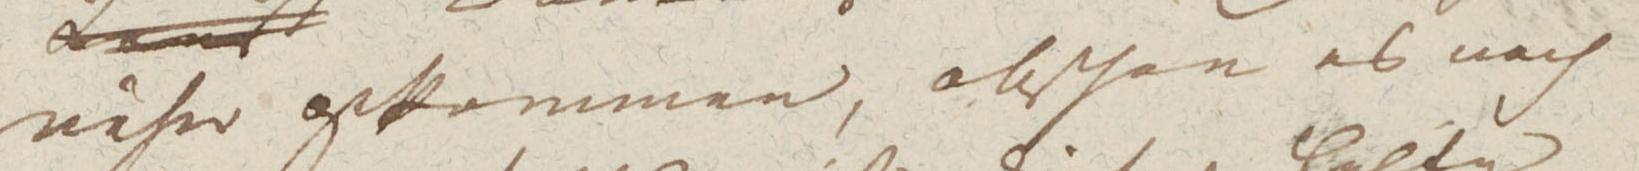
näher gekommen, obschon es noch
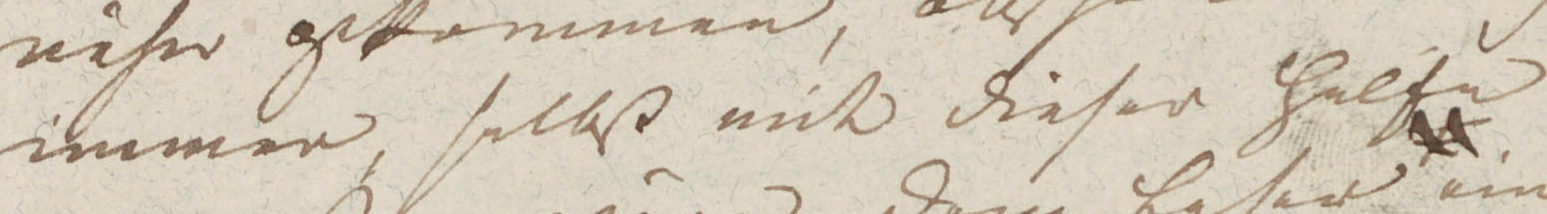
immer, selbst mit dieser Hülfe
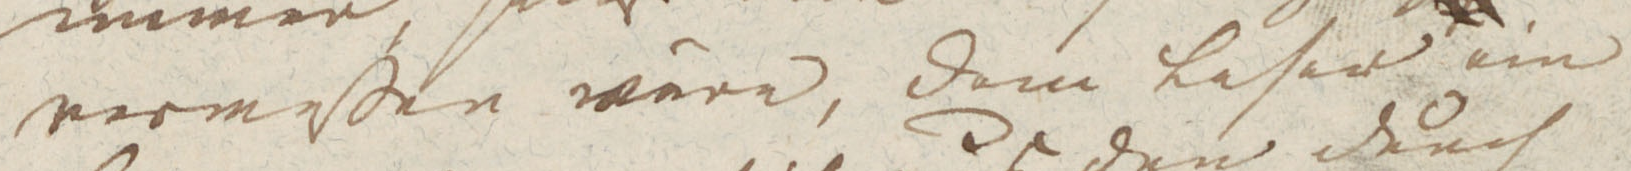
vermessen wäre, dem Leser % ein
